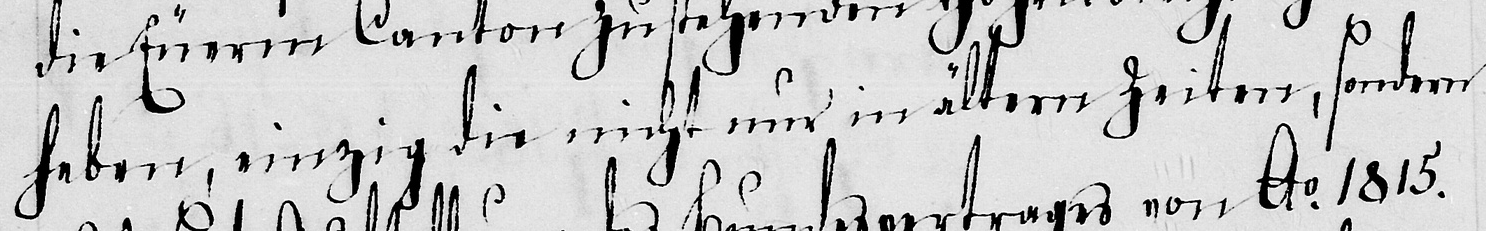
heben, einzig die nicht nur in ältern Zeiten, sondern
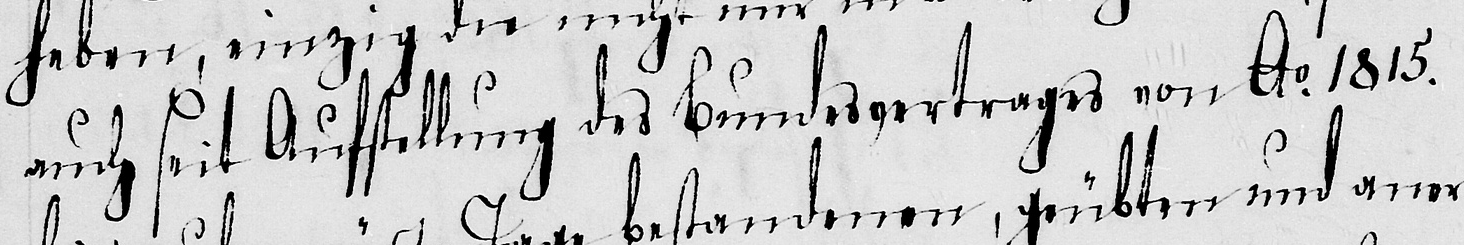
auch seit Aufstellung des Bundesvertrages von Ao. 1815.
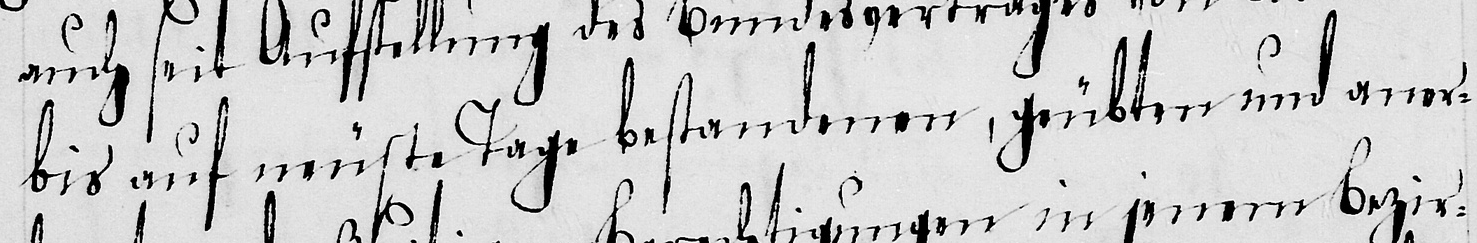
bis auf neuste Tage bestandenen, geübten und aner¬
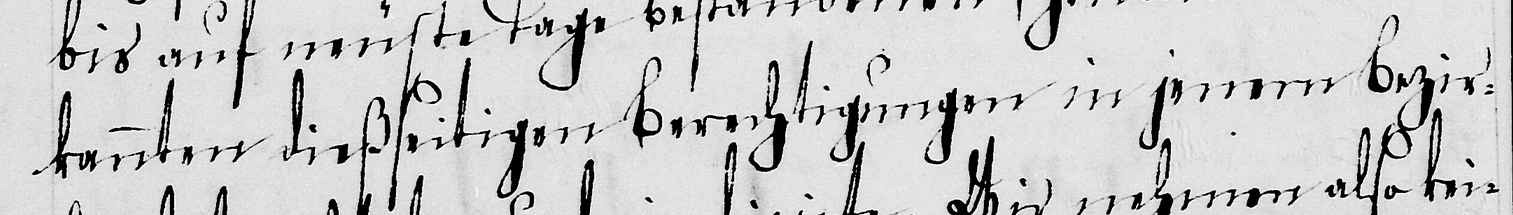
kannten dießseitigen Berechtigungen in jenem Bezir¬
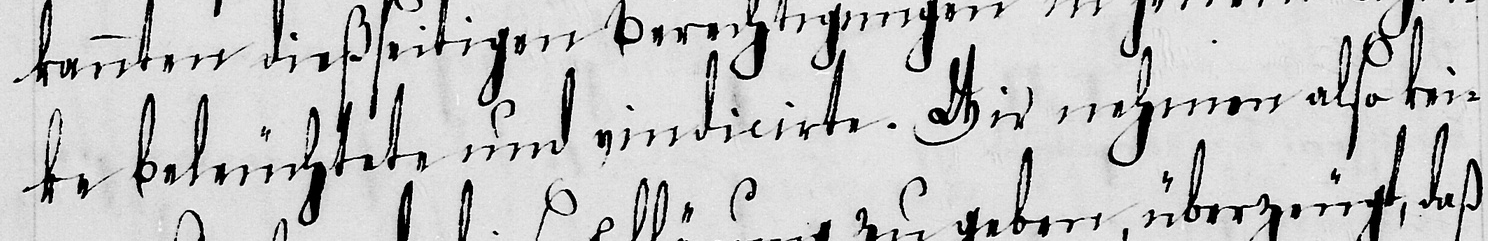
ke beleuchtete und vindicirte. Wir nehmen also ke¬
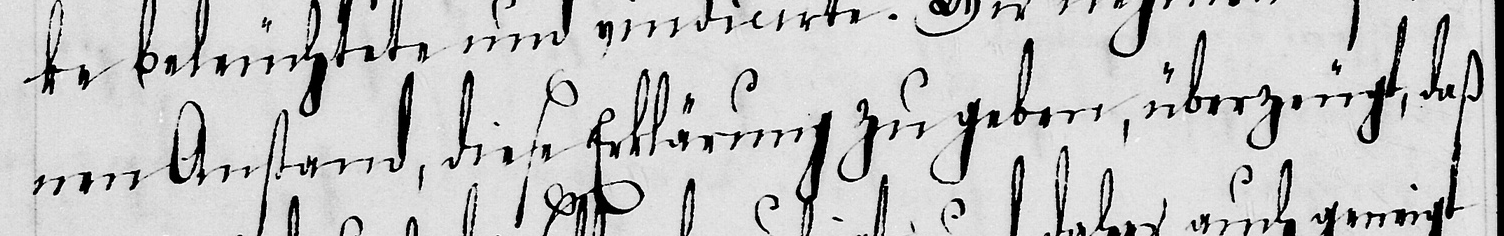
inen Anstand, diese Erklärung zu geben, überzeugt, daß
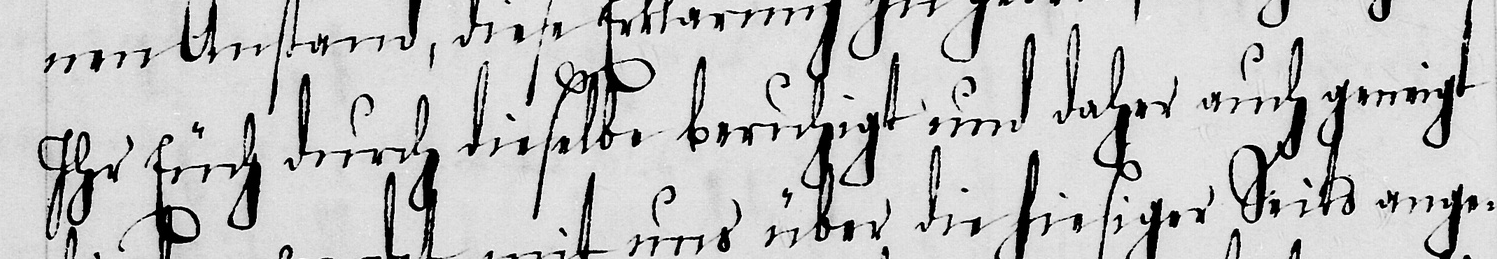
Ihr Euch durch dieselbe beruhigt und daher auch gene¬
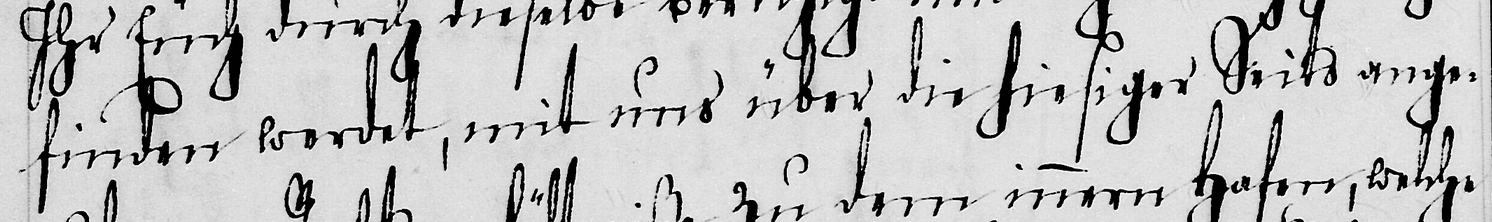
finden werden, mit uns über die hiesiger Seits ange¬
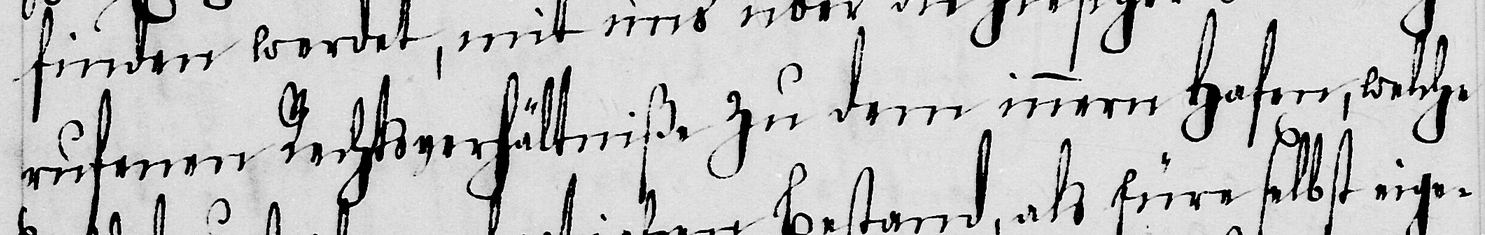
rufenen Rechtsverhältniße zu dem innern Hafen, welche
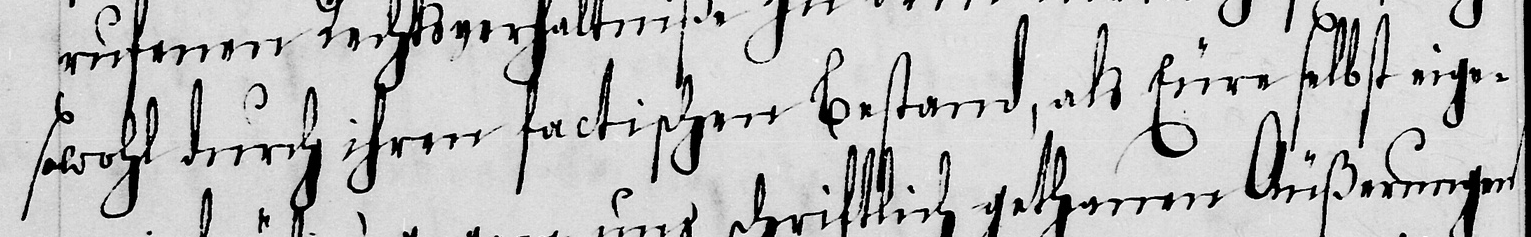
sowohl durch ihren factischen Bestand, als Eure selbst eige¬
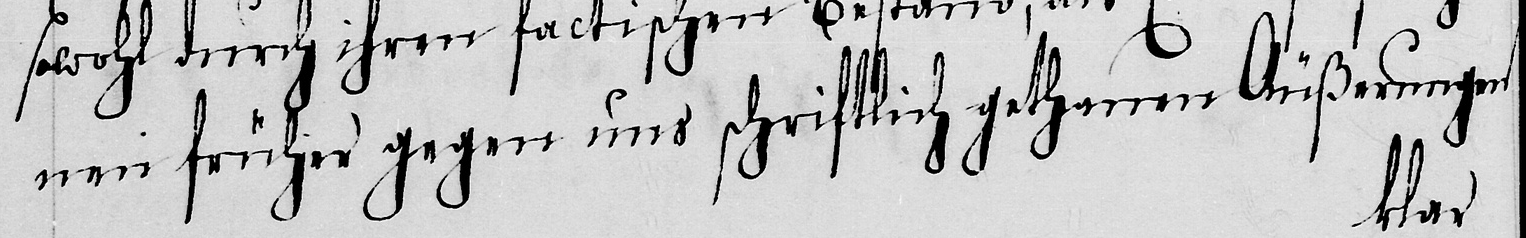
nen früher gegen uns schriftlich gethanen Äußerungen
